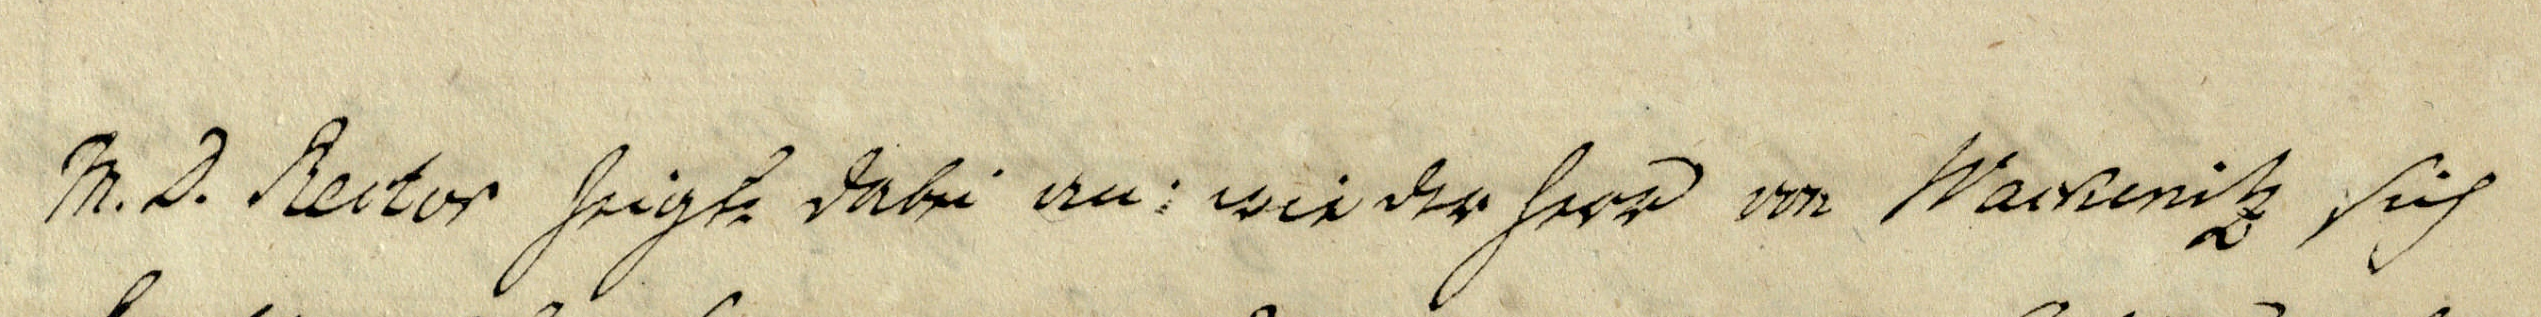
M. D. Rector zeigte dabei an: wie der Herr von Wackenitz sich
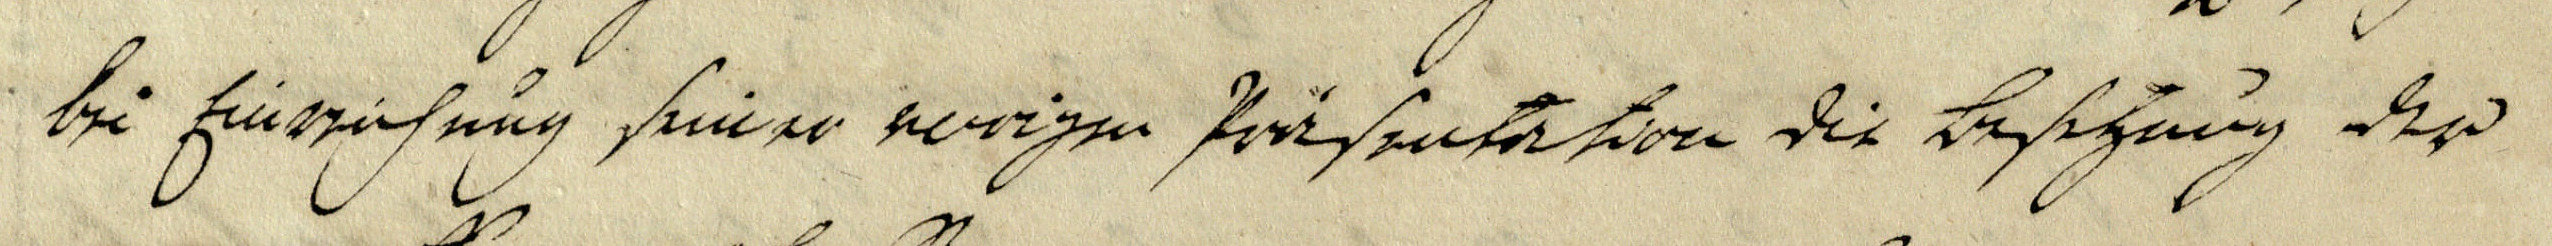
bei Einreichung seiner vorigen Präsentation die Besetzung der
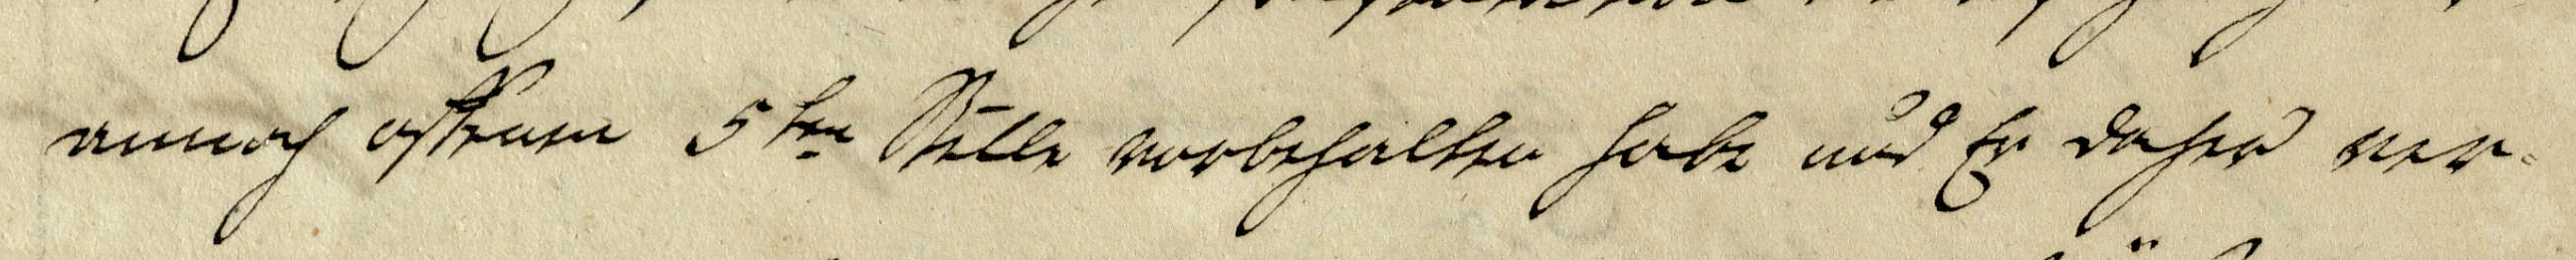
annoch offenen 5 ten Stelle vorbehalten habe und Er daher ver¬
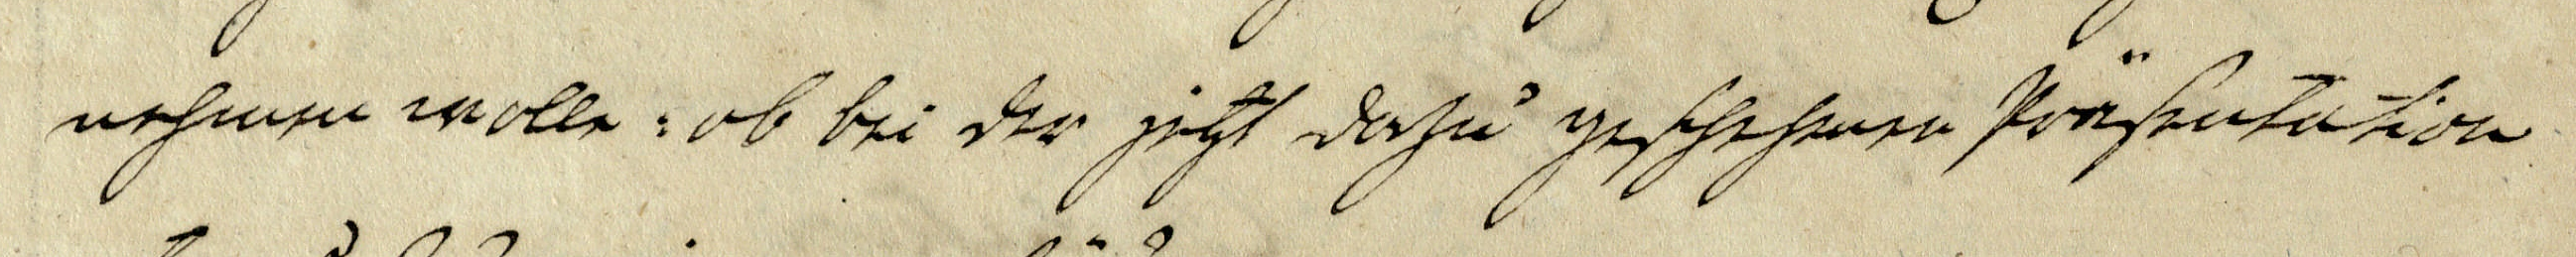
nehmen wolle: ob bei der jetzt dazu geschehenen Präsentation
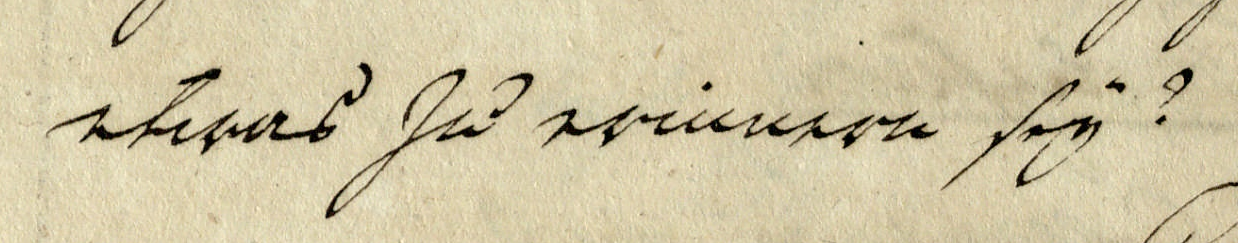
etwas zu erinnern seÿ?
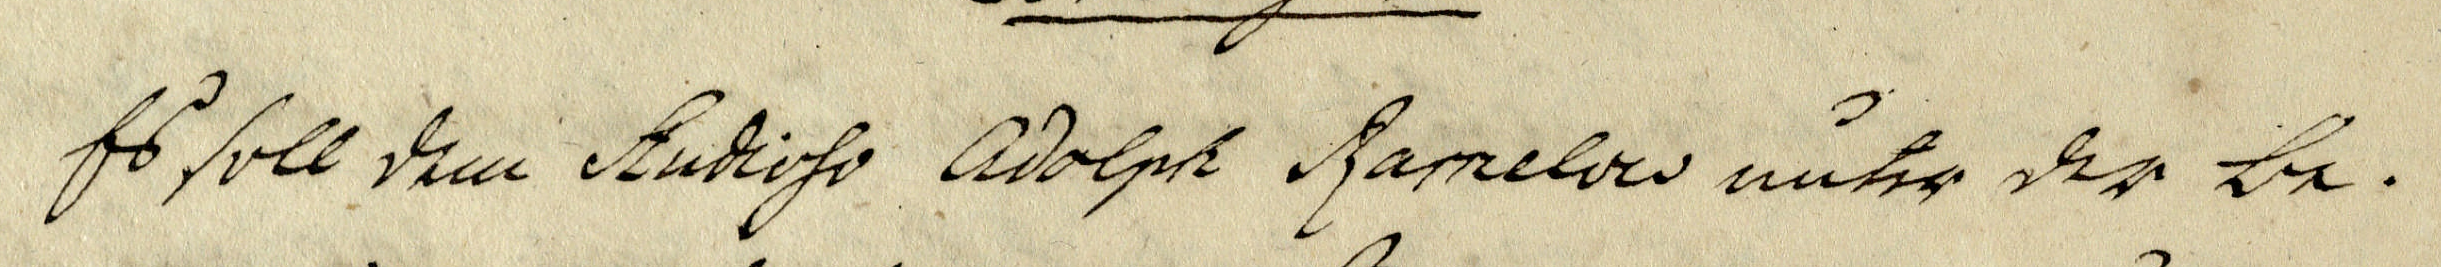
Es soll dem Studioso Adolph Ramelow unter der Be¬
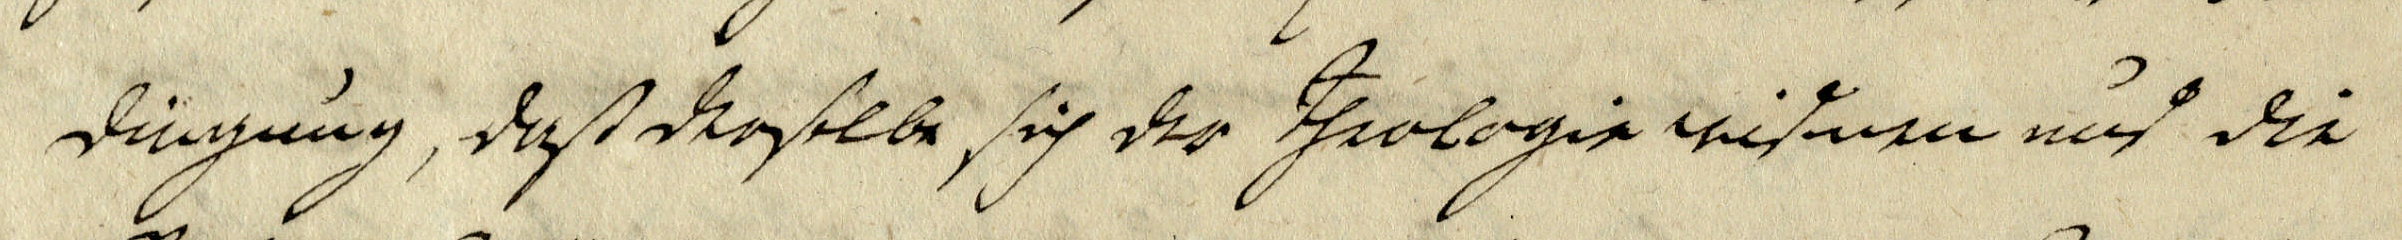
digung, daß derselbe sich der Theologie widmen und die
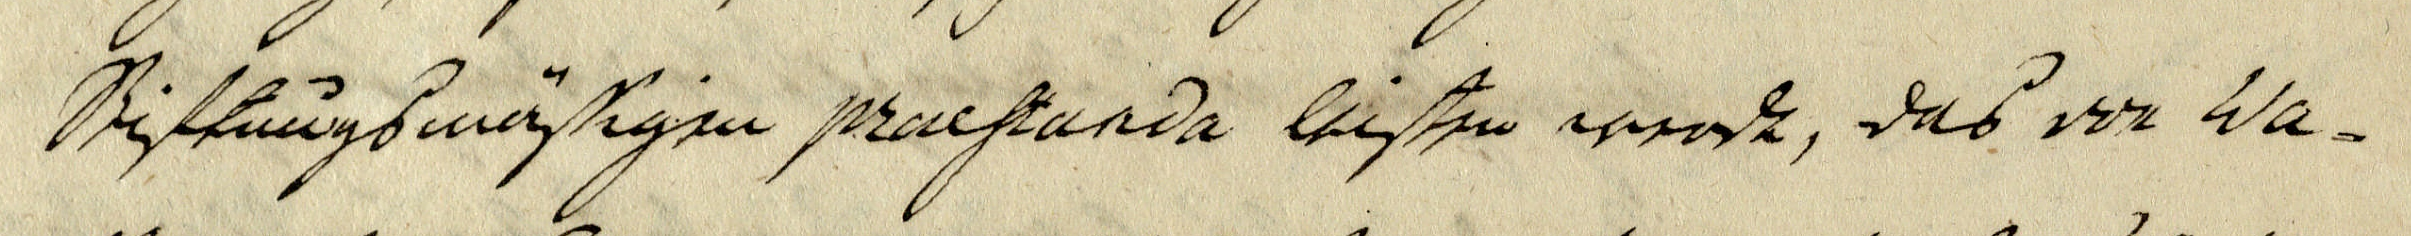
Stiftungsmässigen praestanda leisten werde, das von Wa¬
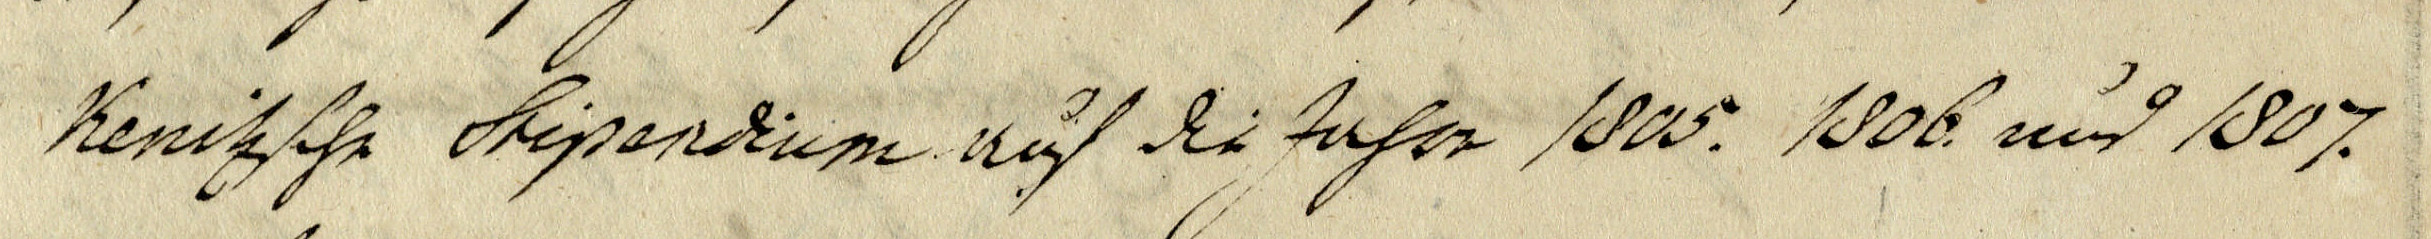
kenitzsche Stipendium auf die Jahre 1805. 1806. und 1807.
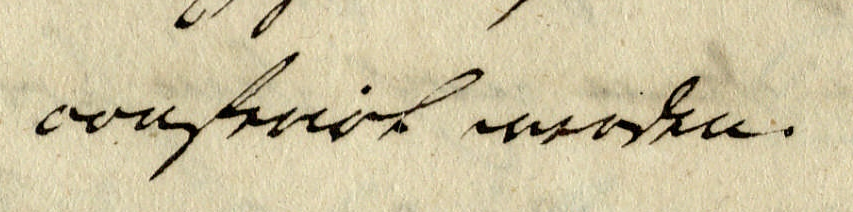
conferirt werden.
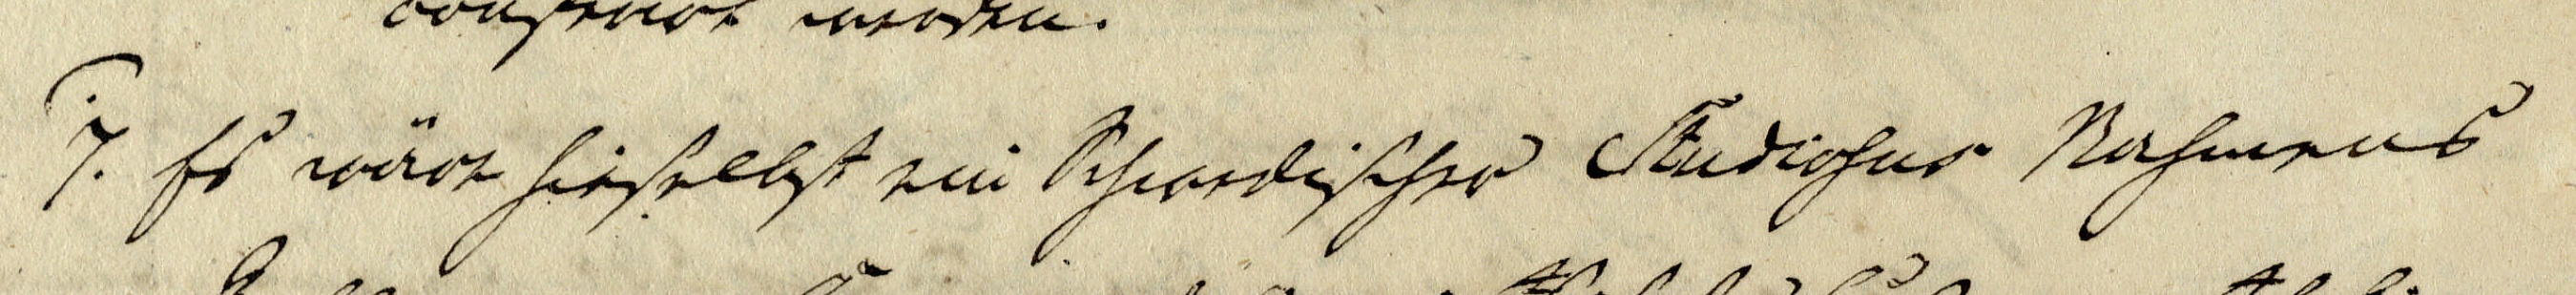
7. Es wäre hieselbst ein Schwedischer Studiosus Nahmens
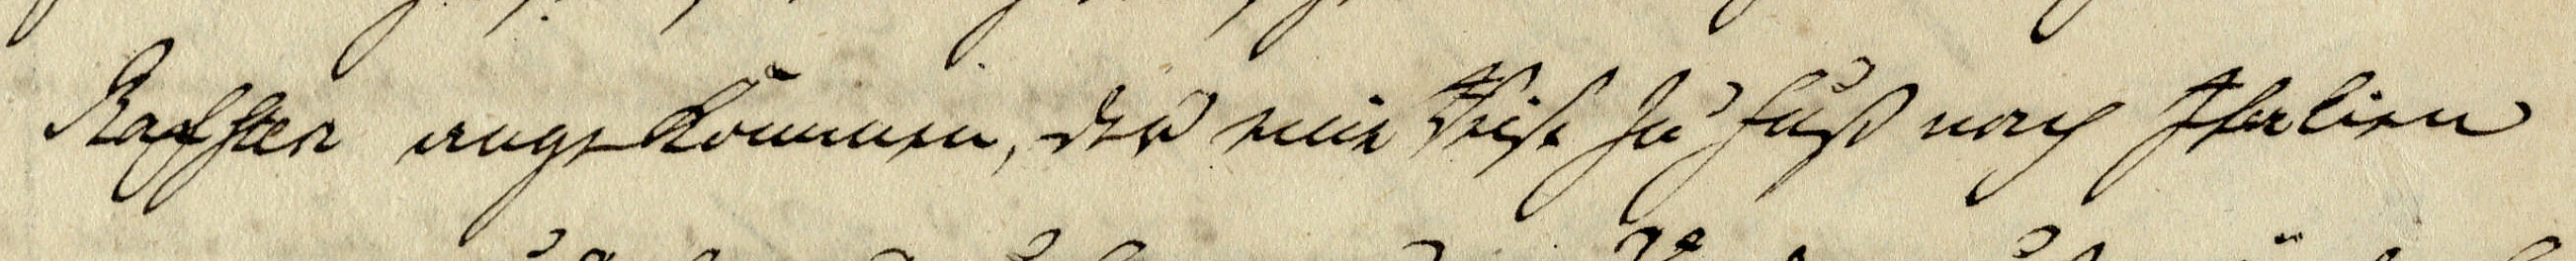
Rafsten angekommen, der eine Reise zu Fuß nach Italien
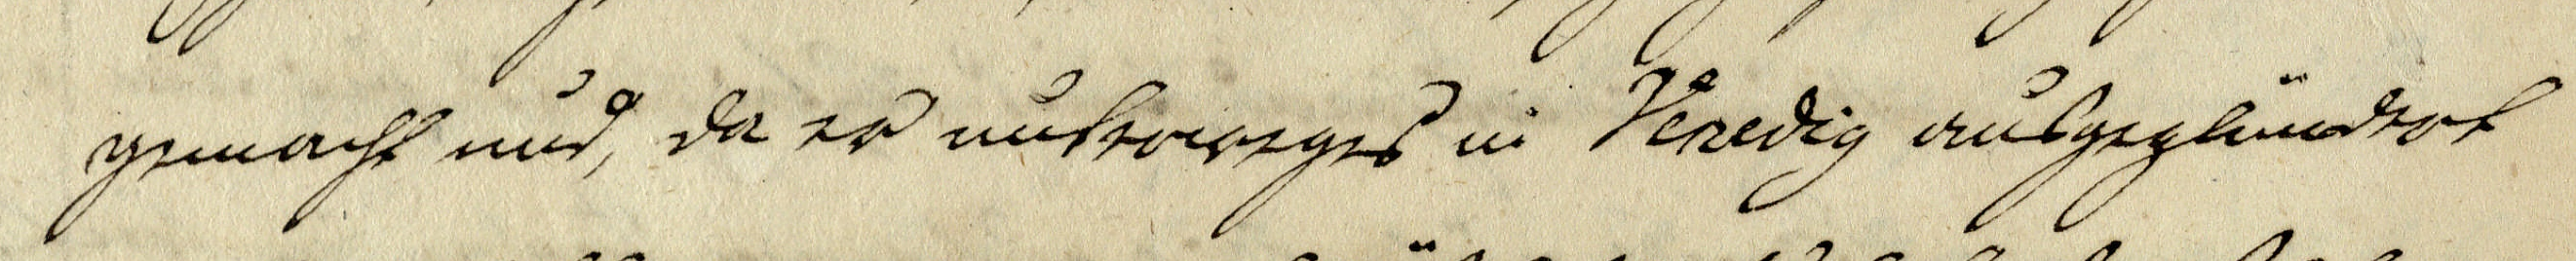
gemacht und, da er unterweges in Venedig ausgeplündert
